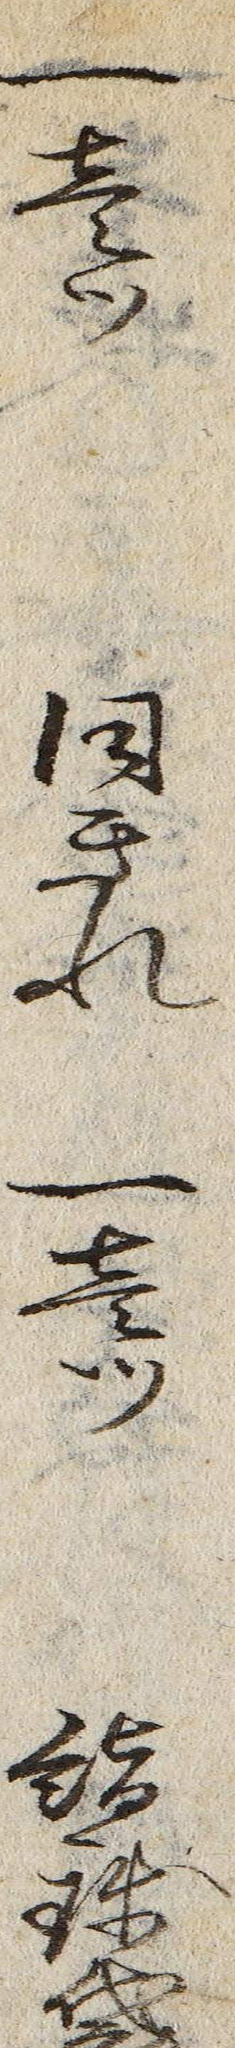一壱ツ同きれ一壱ツ絹銭袋
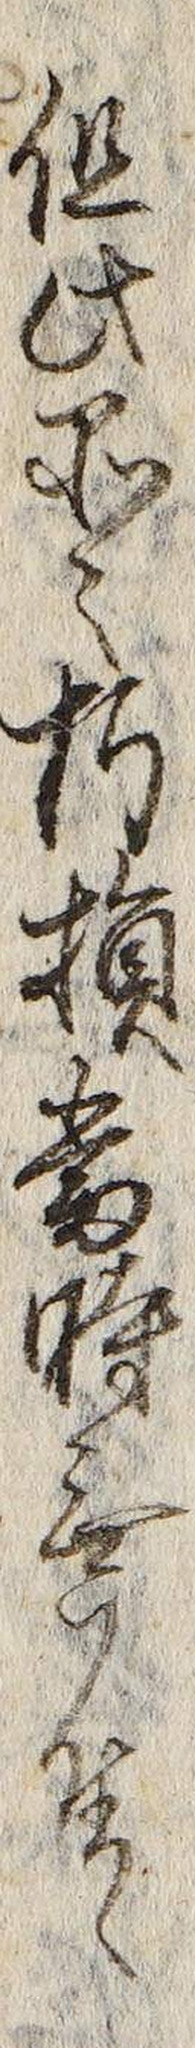但此品の朽損当時無御座候
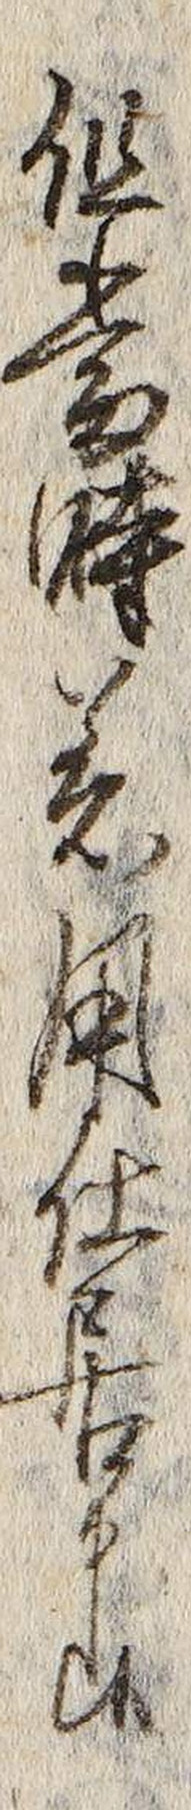但当時着用仕居申候
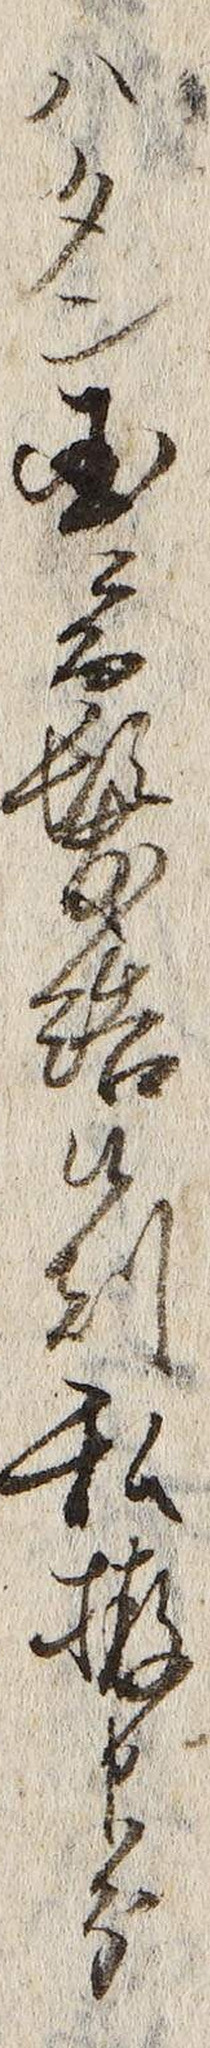ハタン国にて髪結候刻私拵申分
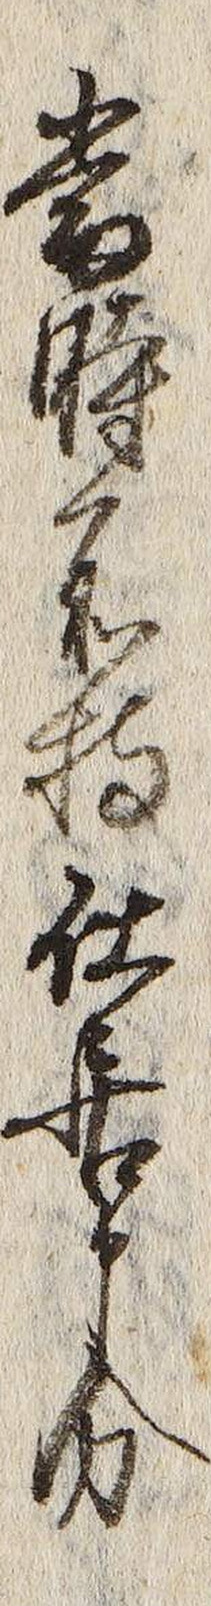当時取持仕居申分
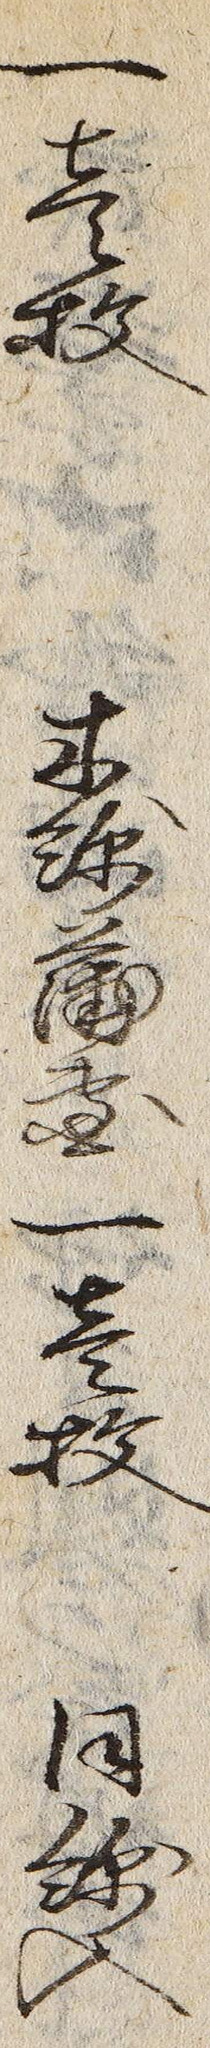一壱枚木綿布団一壱枚同綿入
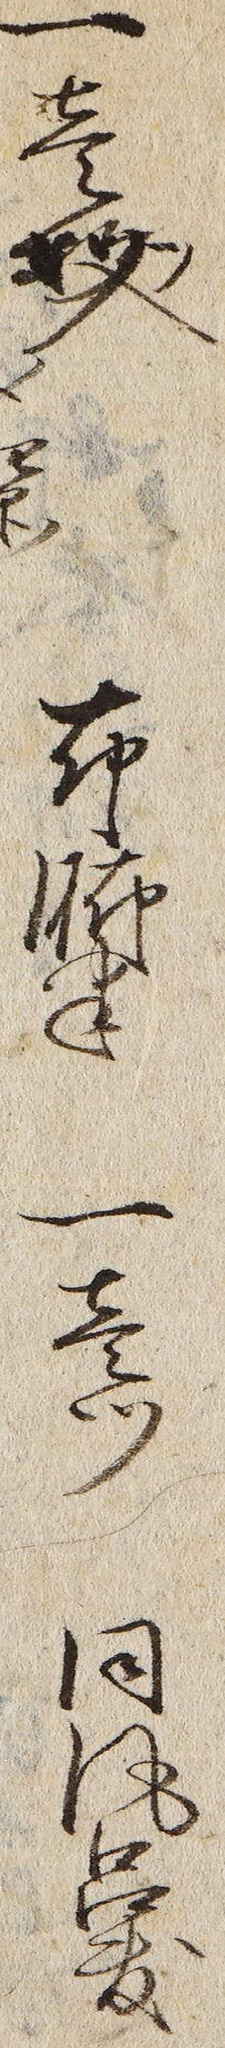一壱ツ布脚絆一壱ツ同風呂敷
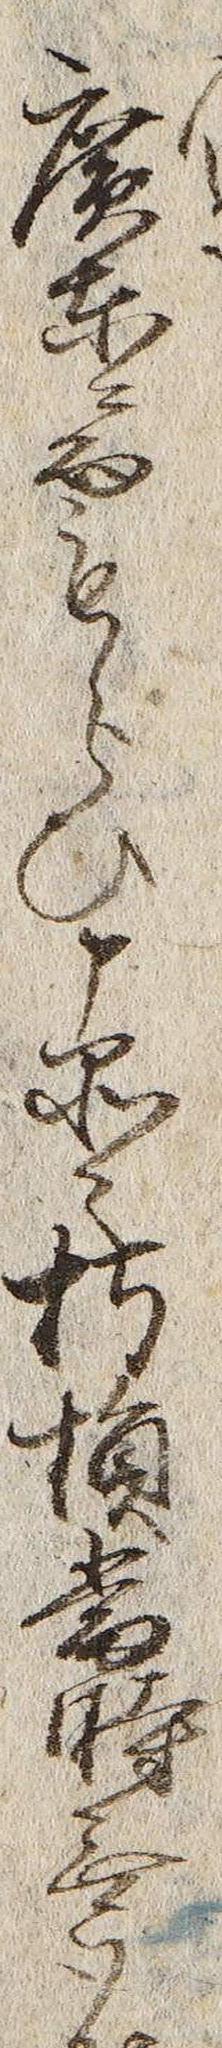広東にてもらひ申品々朽損当時無御座分
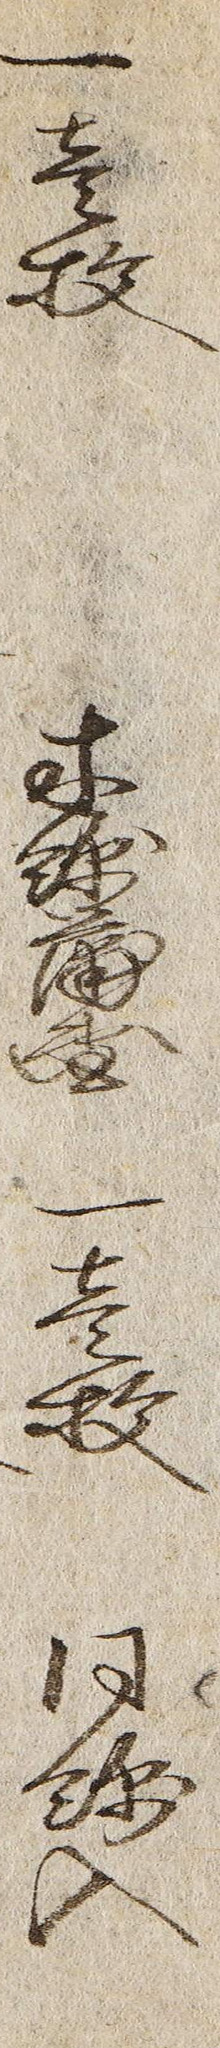一壱枚木綿布団一壱枚同綿入
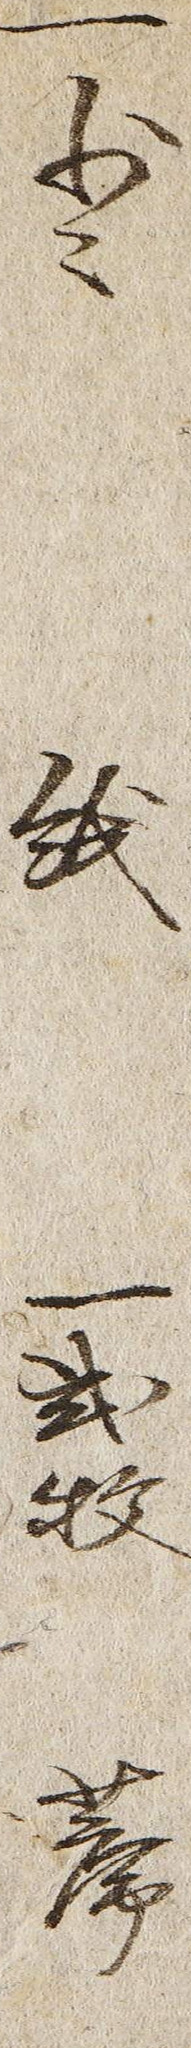一少々紙一二枚薦
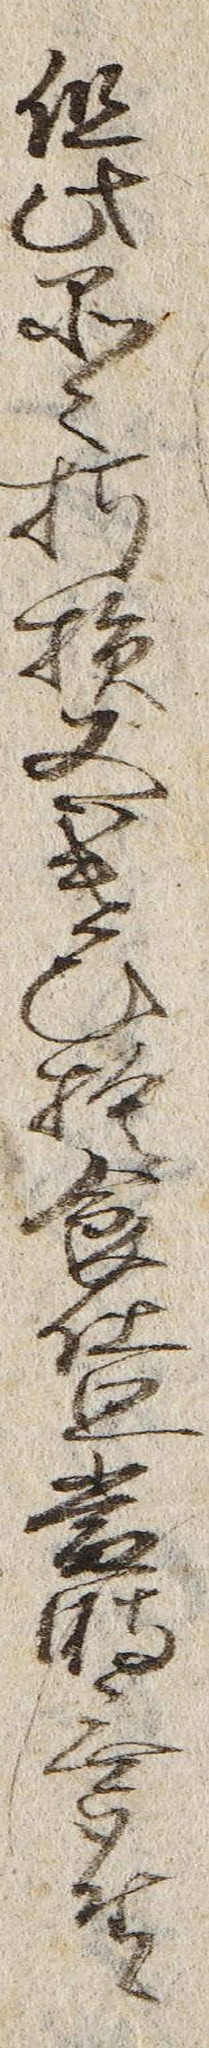但此品々朽損又は遣ひ捨食仕廻当時無御座候

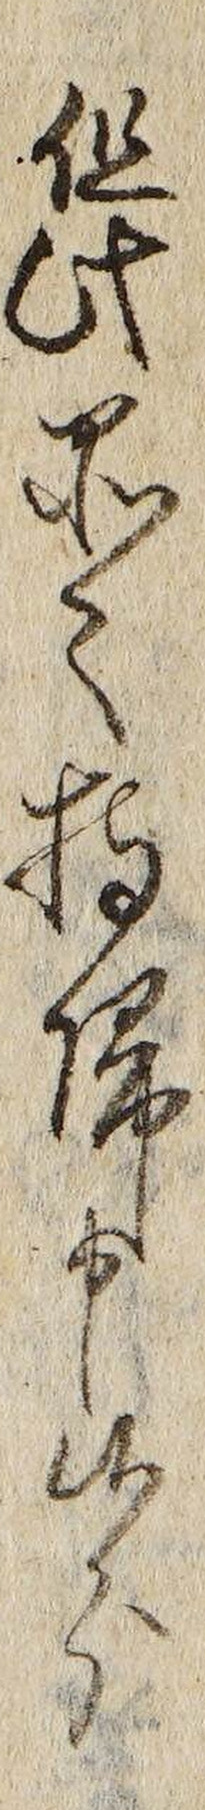但此品々持帰申候分
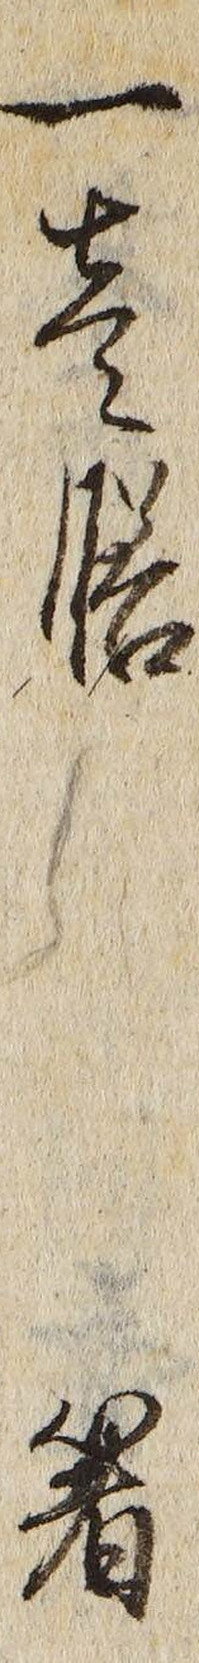一壱膳箸
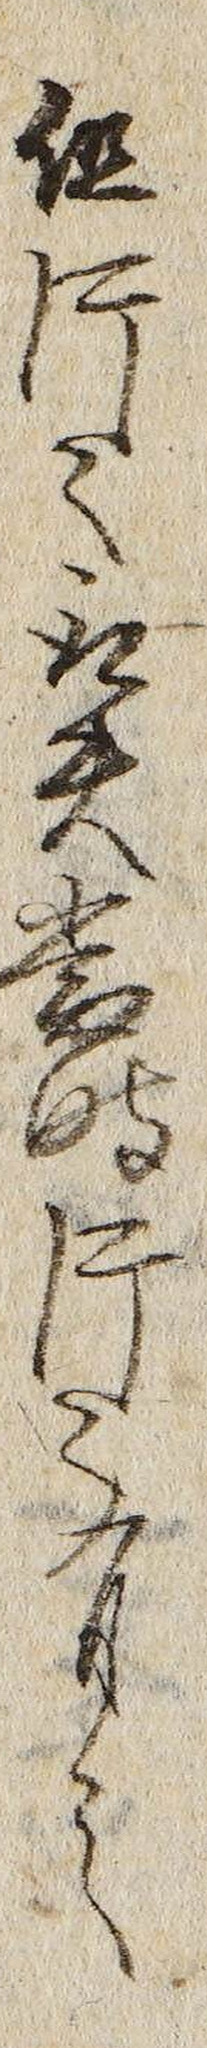但片々取失当時片々有之
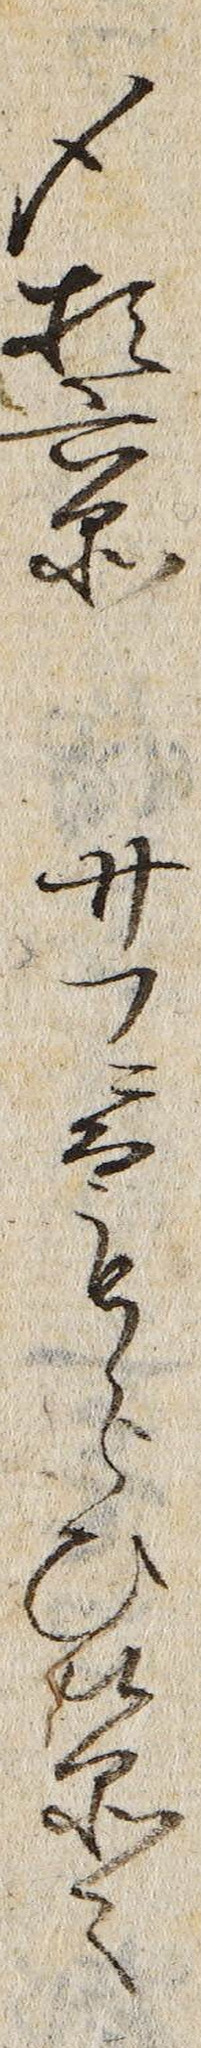しめて十六品サフにてもらひ候品々
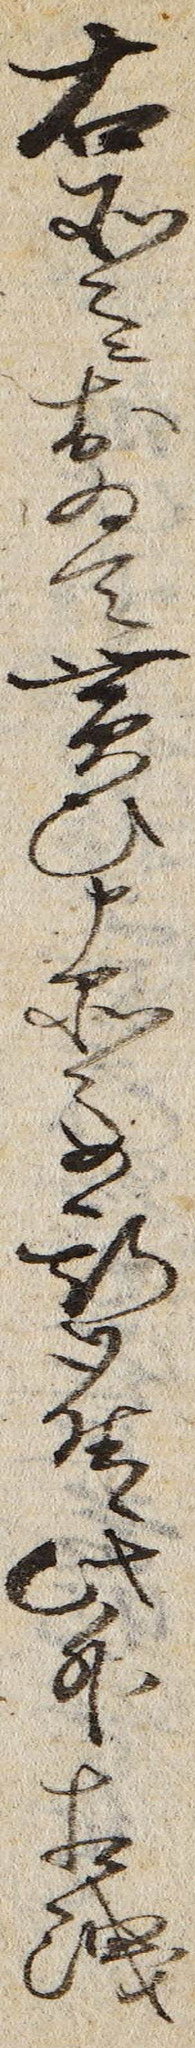右品々におゐて貰ひ申品々如斯御座候此外相洩
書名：能登国清兵衛異国江漂流之始末
